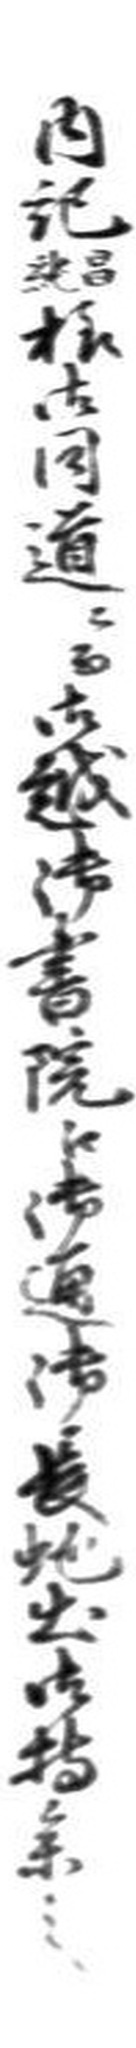純様御同道ニ而御越御書院江御通御長蚫出御持参之
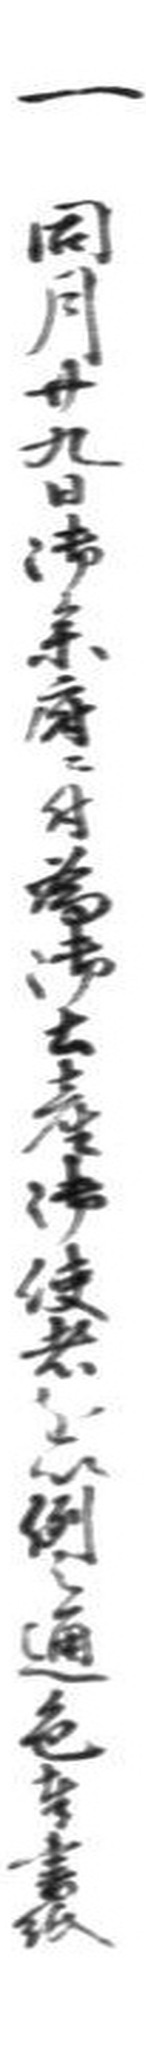一同月廿九日御参府ニ付為御土産御使者を以例之通色奉書紙

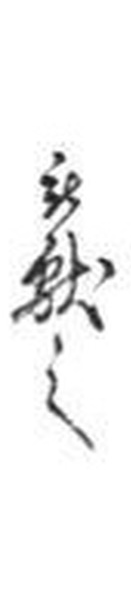被献之
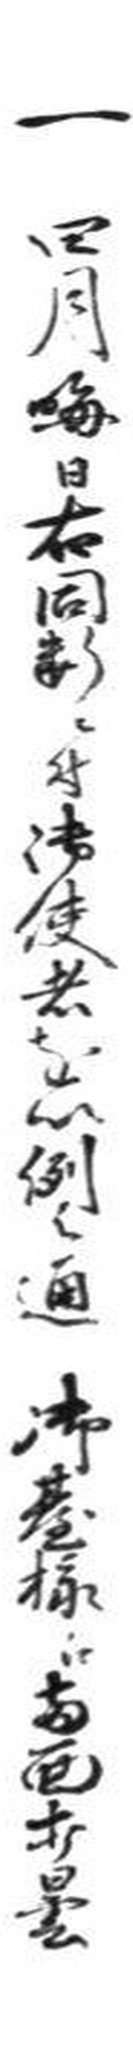一四月晦日右同断ニ付御使者を以例之通御台様江両面打曇
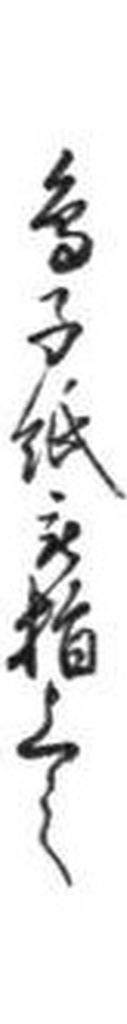鳥子紙被指上之
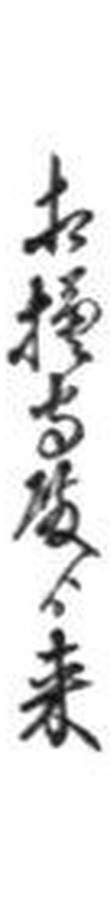相模守殿ゟ来
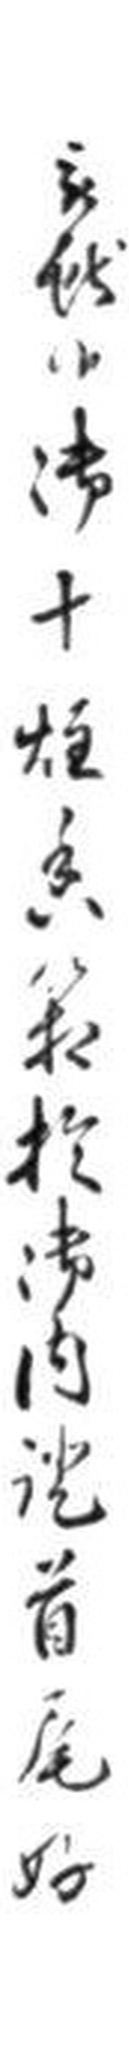被献候御十炷香箱於御内証首尾好
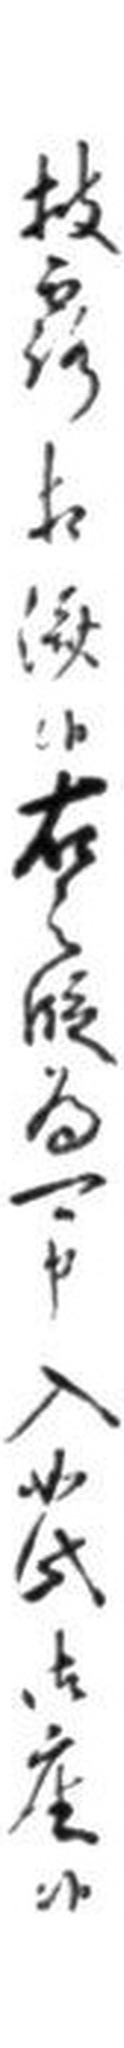披露相済候右之段為可申入如此御座候
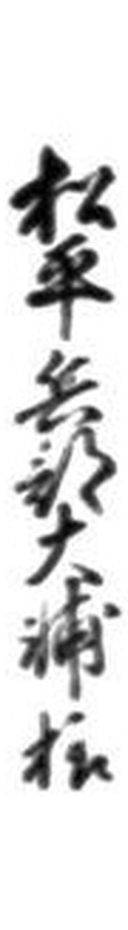松平兵部大輔様
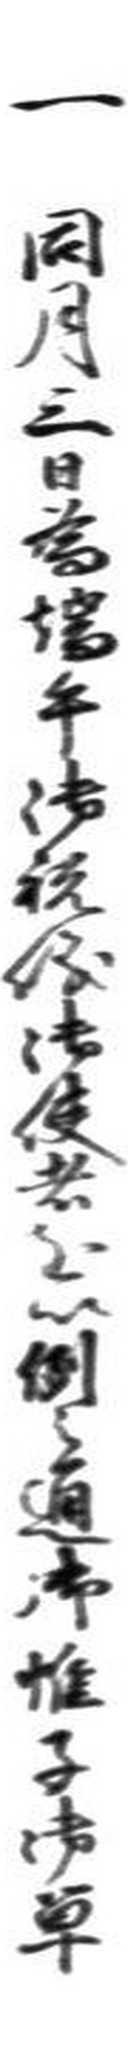一同月三日為端午御祝儀御使者を以例之通御帷子御単
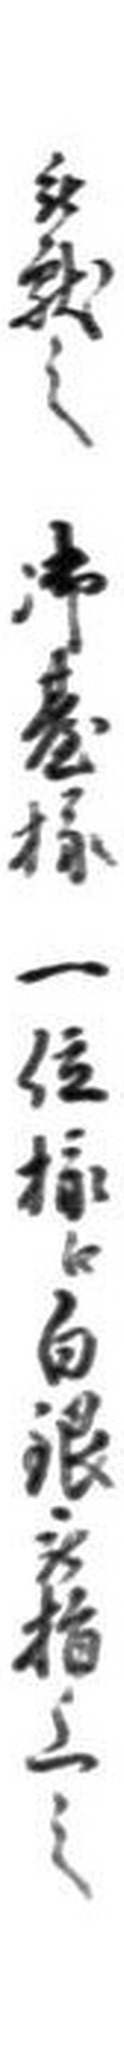被献之御台様一位様江白銀被指上之
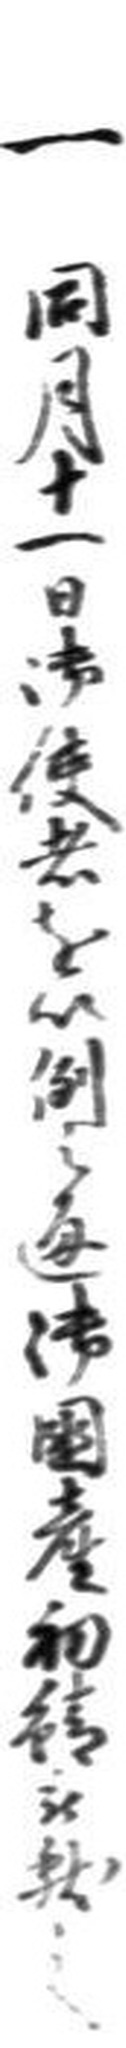一同月十一日御使者を以例之通御国産初鯖被献之
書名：家譜 二十二 吉品公 従元禄十五年到同十六年
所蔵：福井県文書館 Fukui Prefectural Archives
